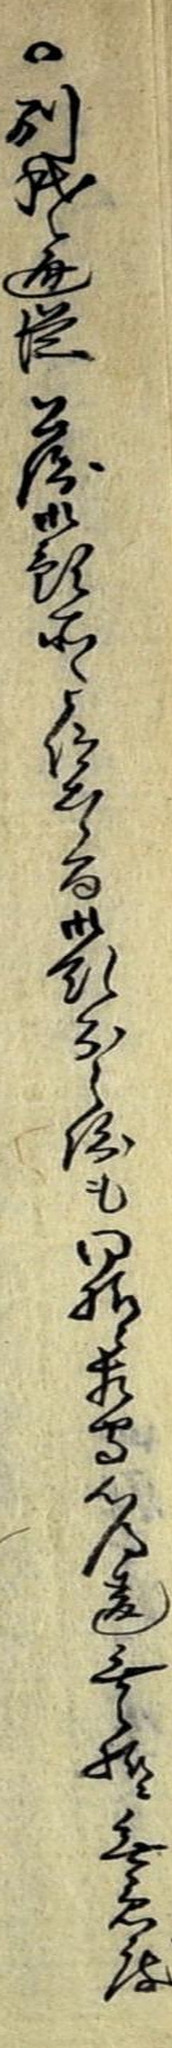〇別紙之通従公儀御預所へ被仰出候間御領分之儀も同様ニ相守心得違無之様ニ無急度
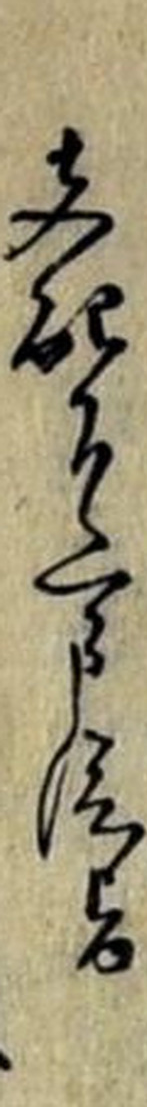支配下へ可申渡旨
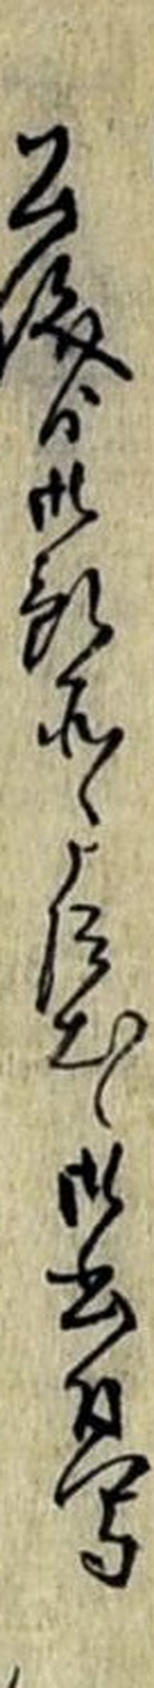公儀ゟ御預所へ被仰出候御書付写
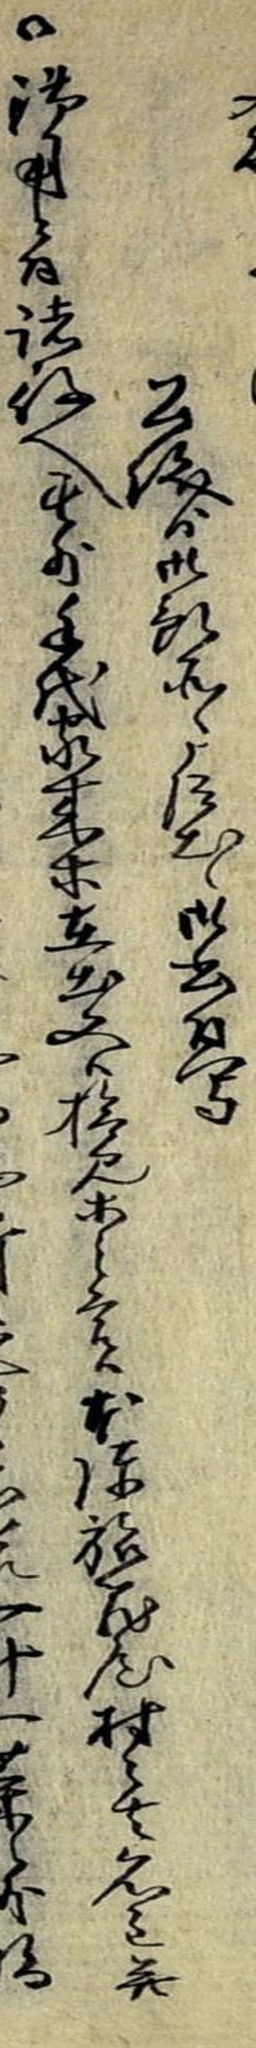〇御用ニ付諸役人其外手代家来等在出又ハ検見等之節ハ本陣旅籠屋村々者名主并
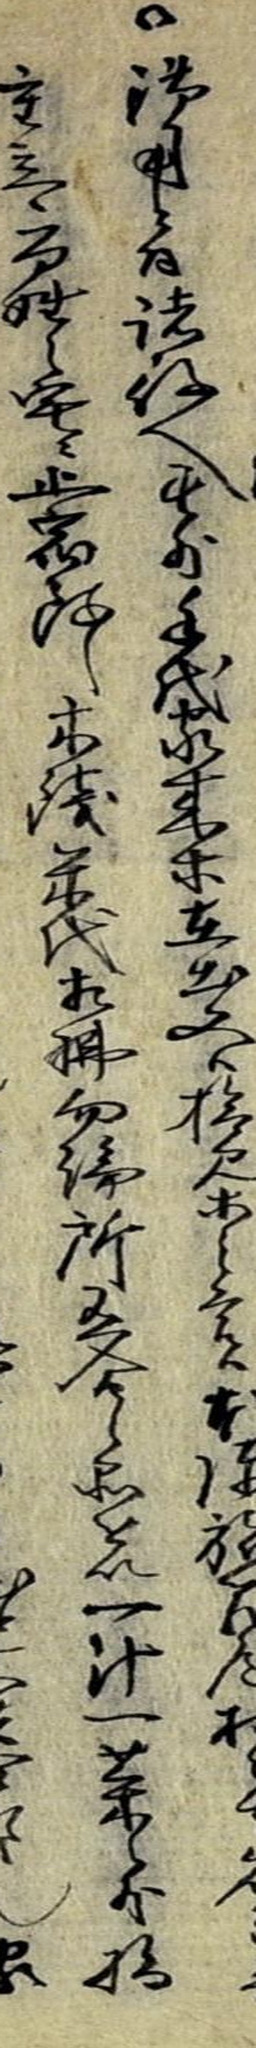重立候百姓之宅ニ止宿致し木銭米代相払勿論所有合之品を以一汁一菜之外指
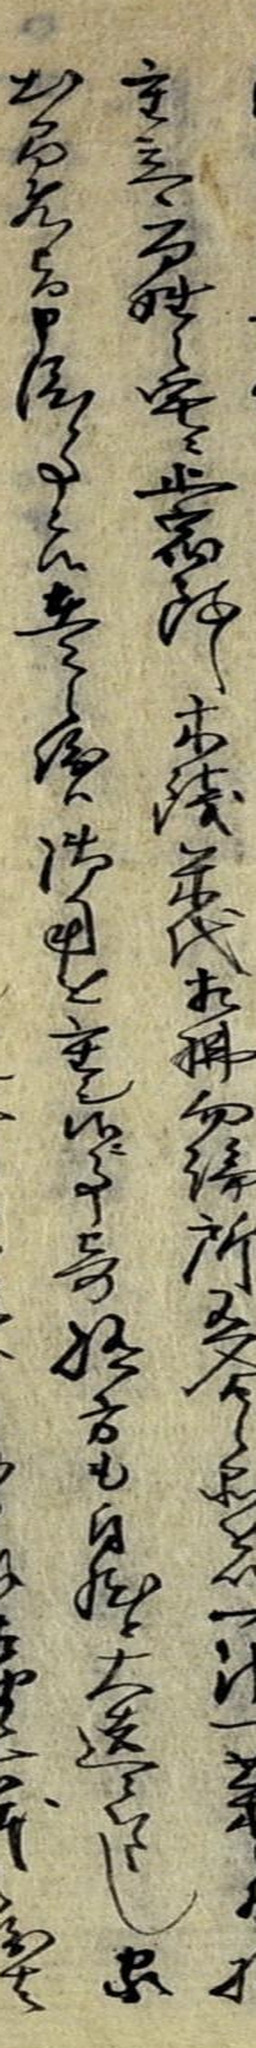出間敷旨申渡候事ニ候在々之儀ハ御用を重シ候ニ事寄賄方も自然と大造ニいたし家
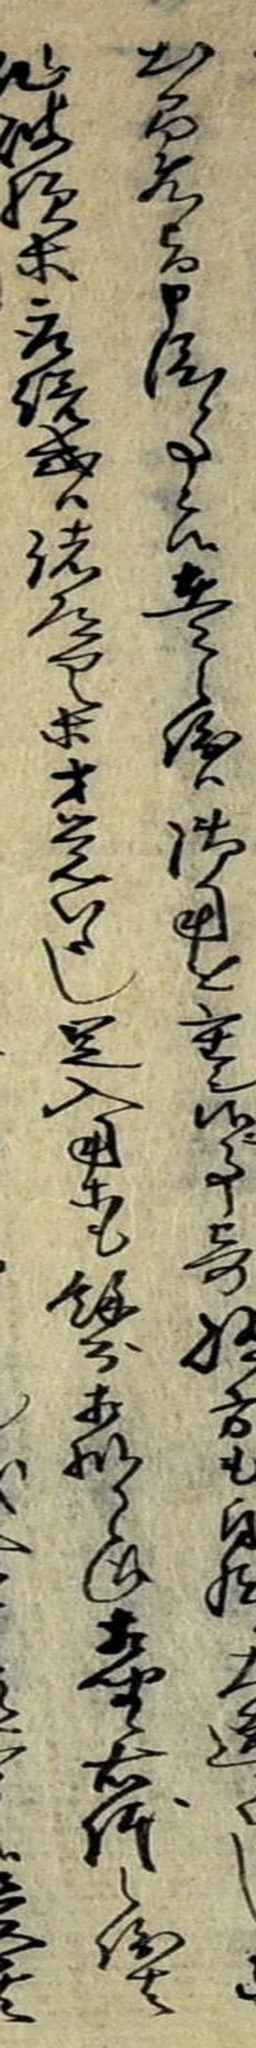作破損等取繕或ハ諸道具等才覚いたし足入用等も余分相掛り候趣相聞候右体之儀者
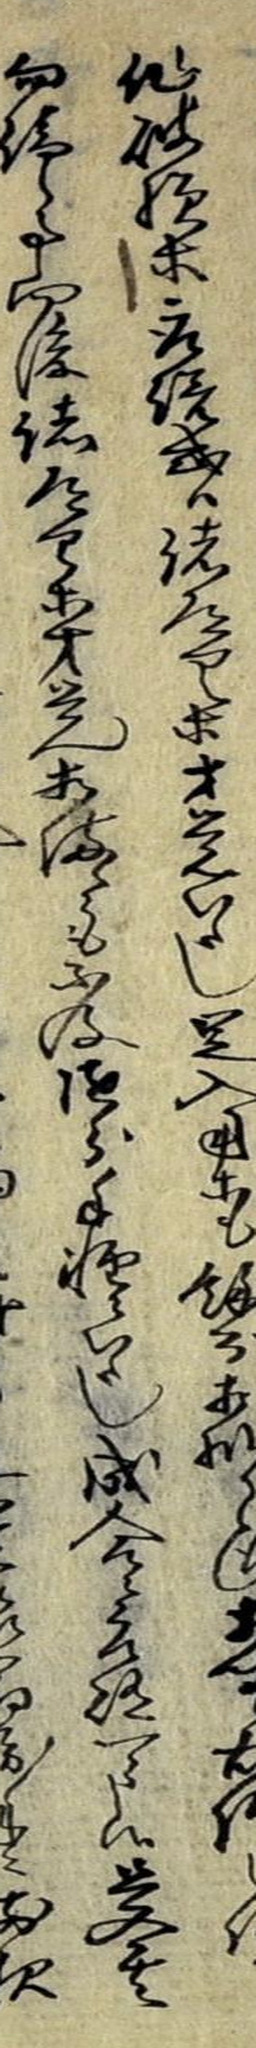勿論之事向後諸道具等才覚相備候とも不及随分手軽ニいたし成合ニ取賄可申候且又其
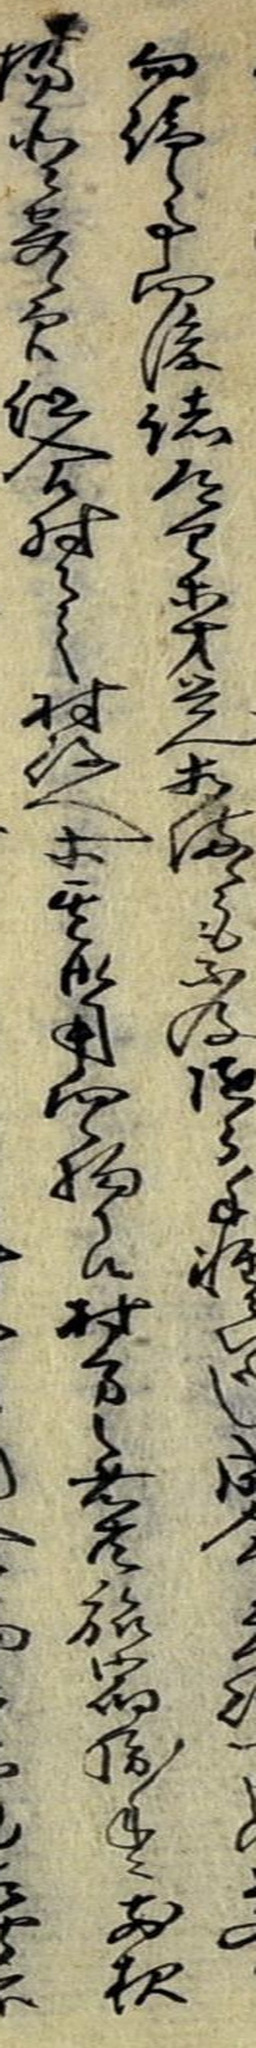場所ニ寄候而ハ組合村々之村役人等其御用向へ拘り候村方之者共旅宿勝手ニ前夜
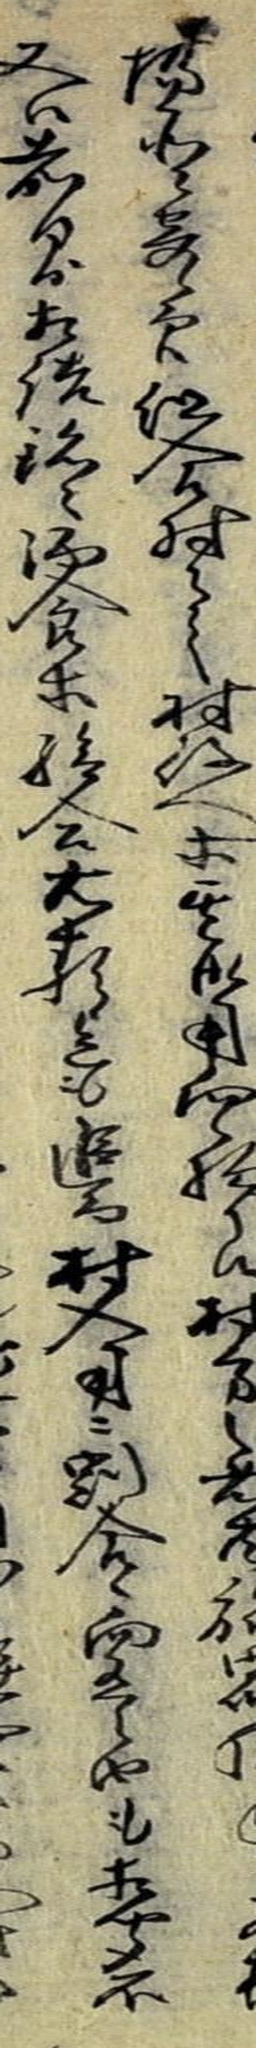又ハ前日ゟ相詰銘々酒食等給合右類迄も追而村入用ニ割合候向有之由も相聞不
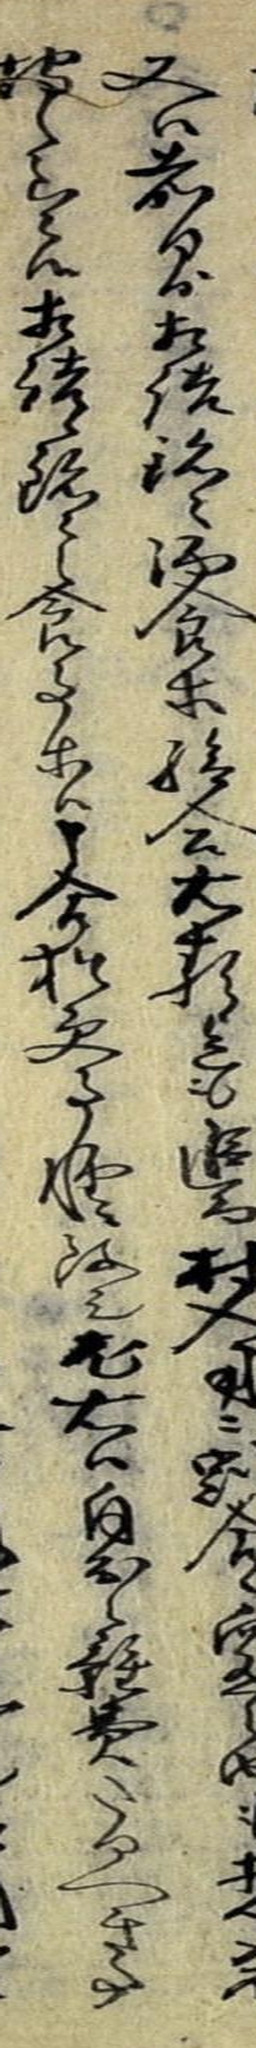埒之至ニ候相詰候銘々之食事等ハ申合猶更事軽ニ致シ尤右ハ自分之雑費たるへき事
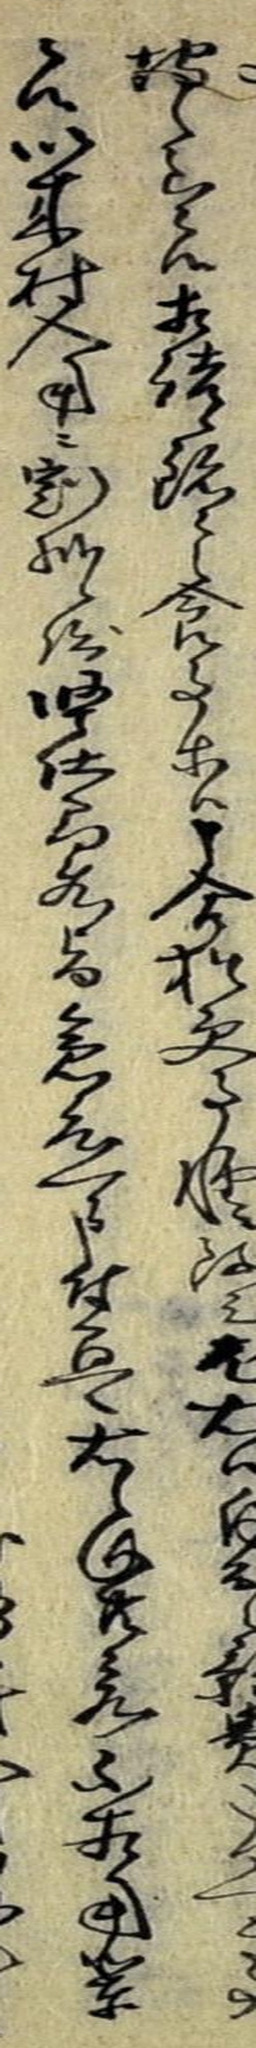ニ候以来村入用ニ割掛候儀堅仕間敷旨急度可申付置候右之趣共若不相用輩
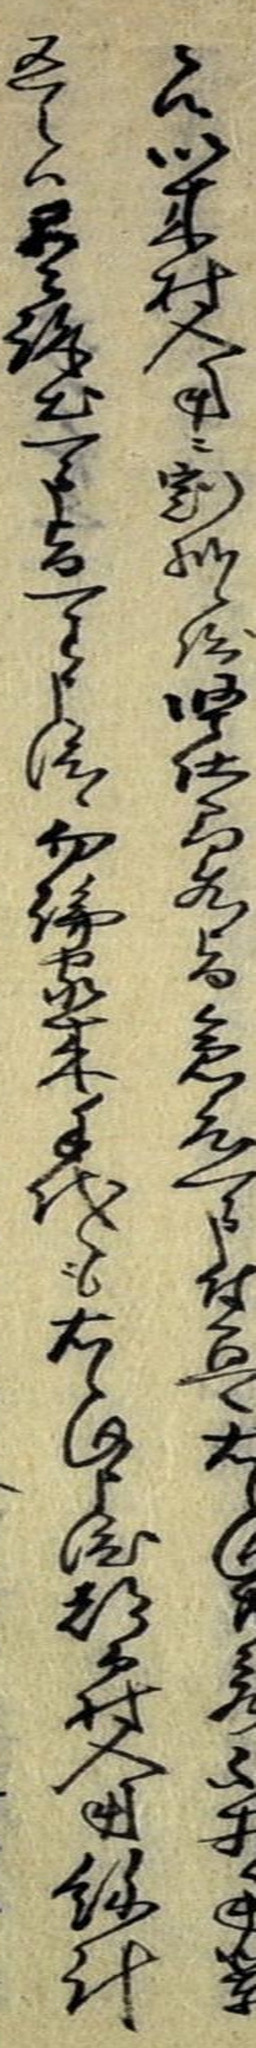有之ハ早々訴出可申旨可被申渡候勿論家来手代へも右之趣申渡都而村入用余計
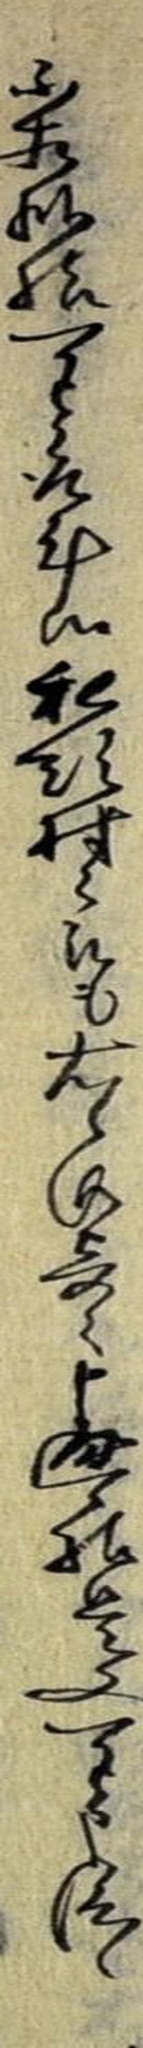不相掛様可被取計候私領村々江も右之趣寄々申通候様是又可被申渡候十月
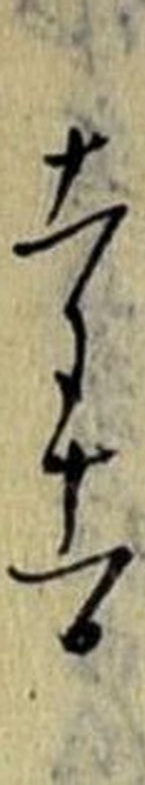十一月十一日
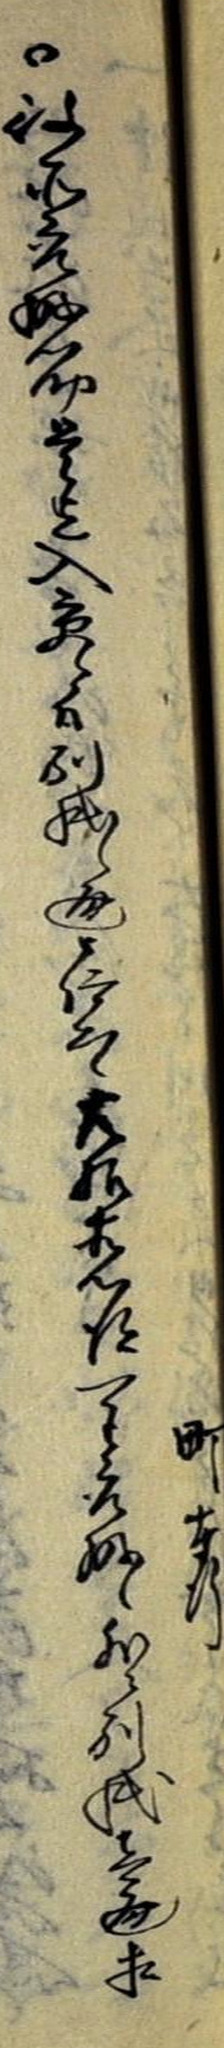〇役所取扱筋是迄入交候ニ付別紙之通被仰出候左様相心得可被取扱候外ニ別紙壱通相
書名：命令之部 三
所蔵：福井県文書館 Fukui Prefectural Archives
